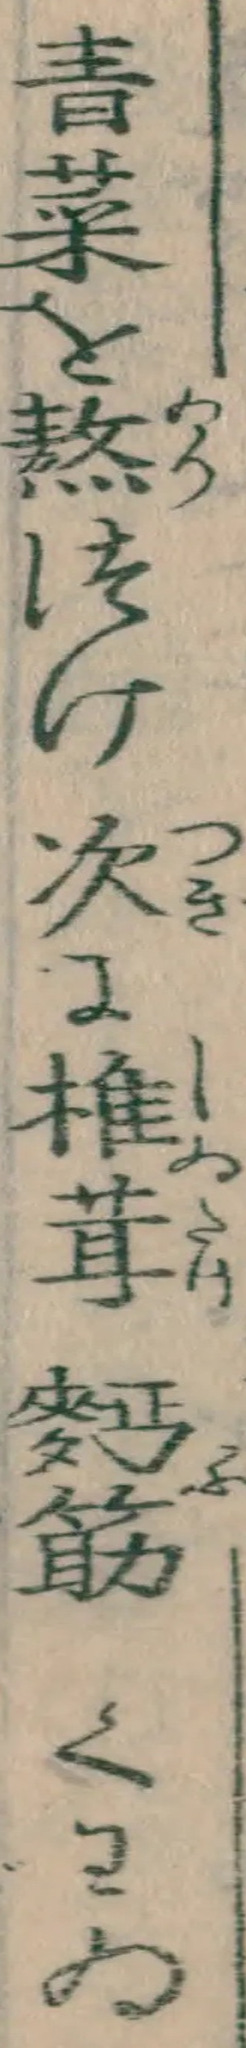青葉を熬つけ次に椎茸麺筋くわゐ
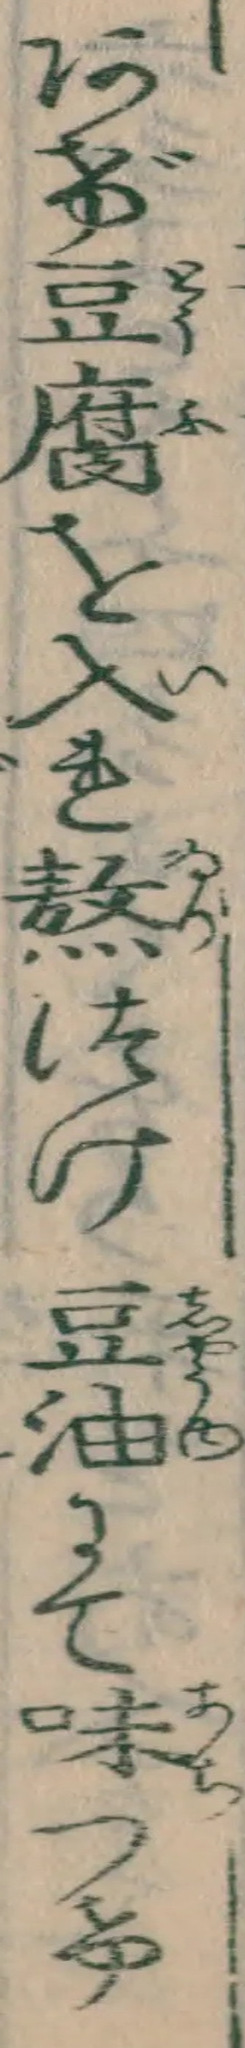あげ豆腐を入れ熬つけ豆油にて味つけ
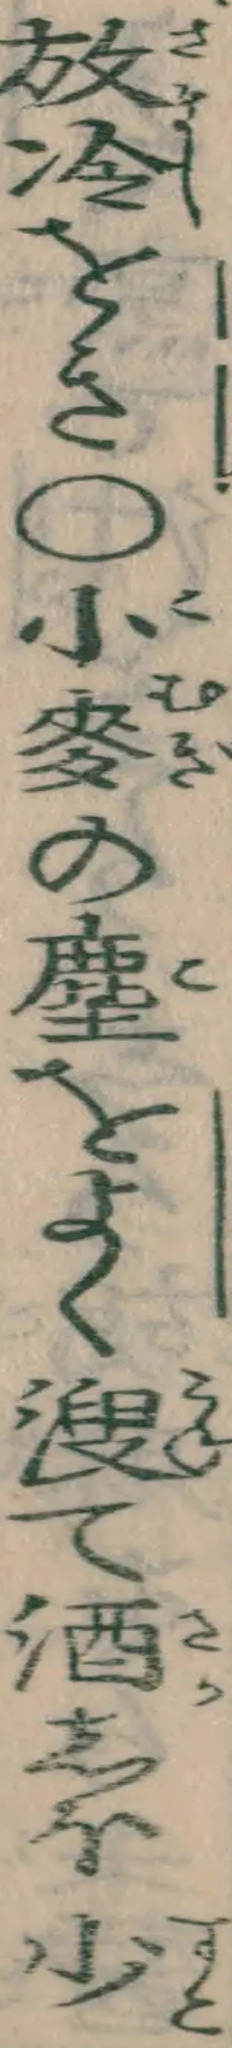放冷をき○小麦の塵をよく溲て酒しほ少
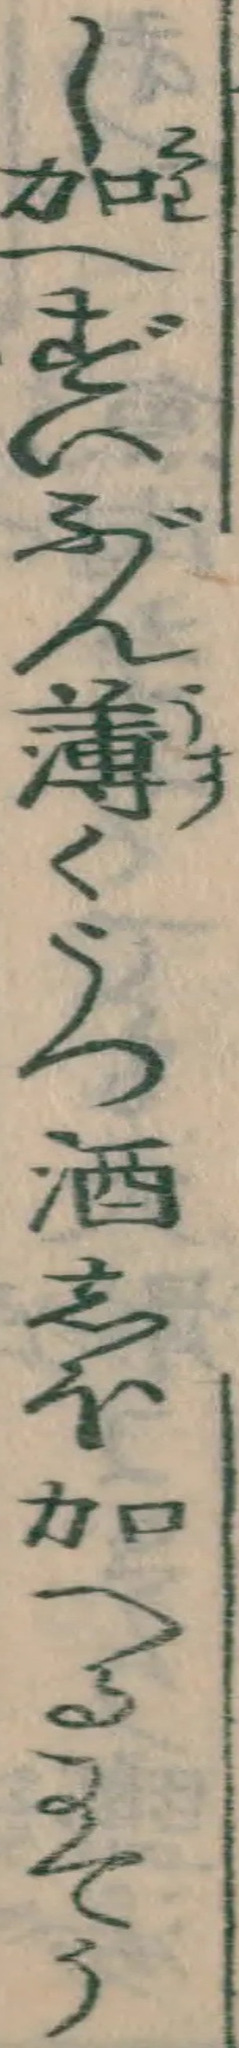し加へずいぶん薄くうつ酒しほ加へるにてう
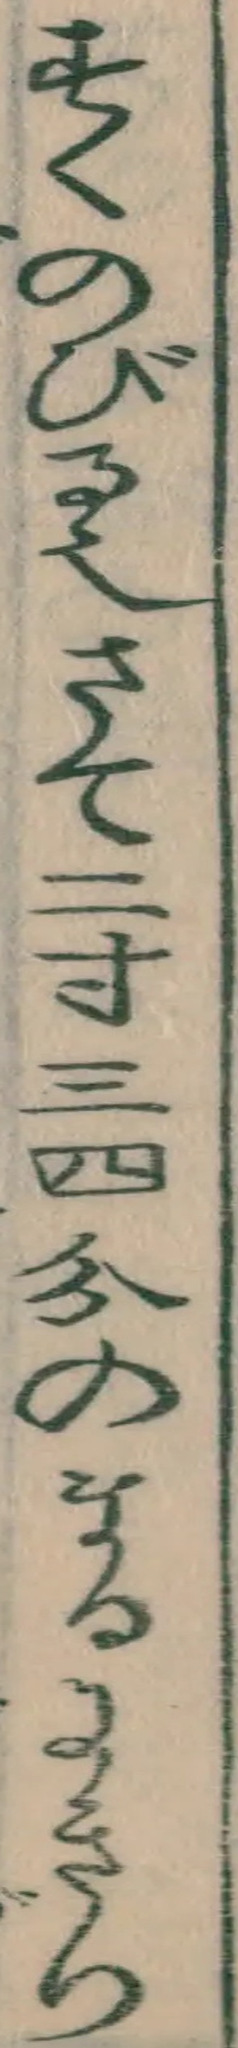すくのびる也さて二寸三四分のまるにきり
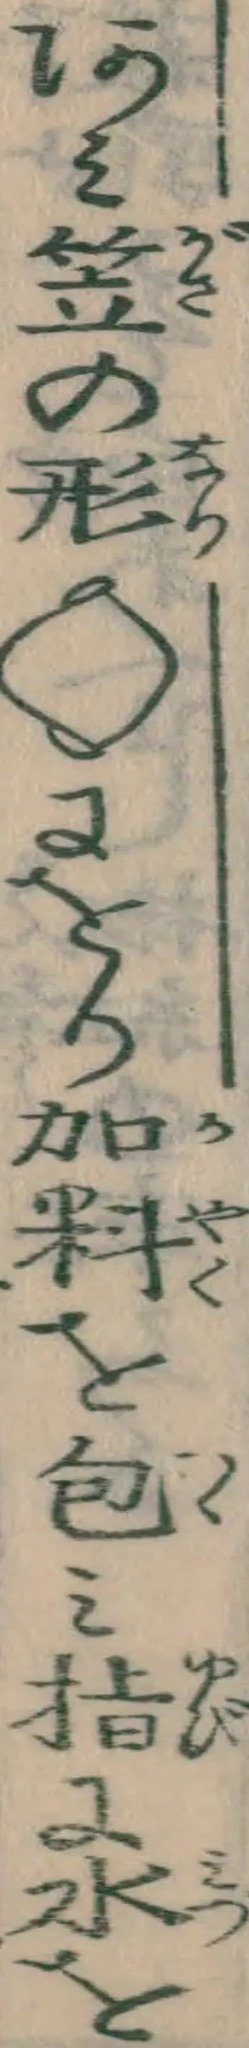あみ笠の形にをり加料を包み指に水を
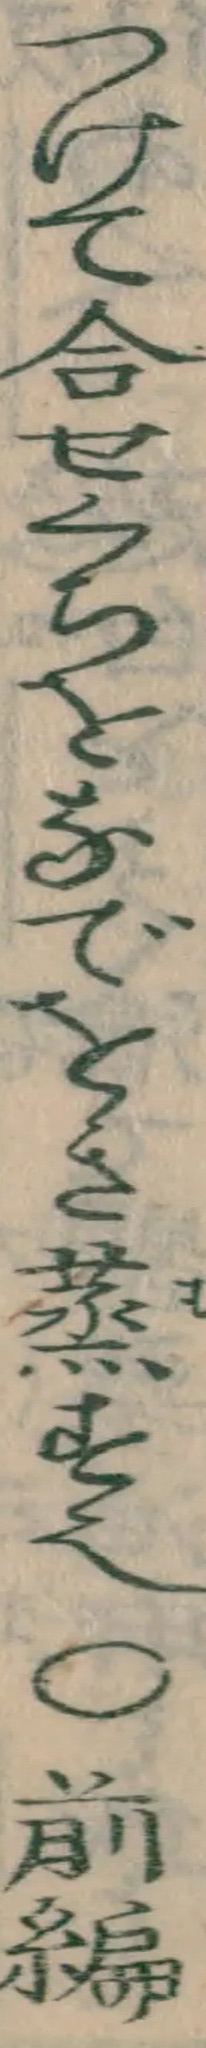つけて合せくちをなでをき蒸す也○前編
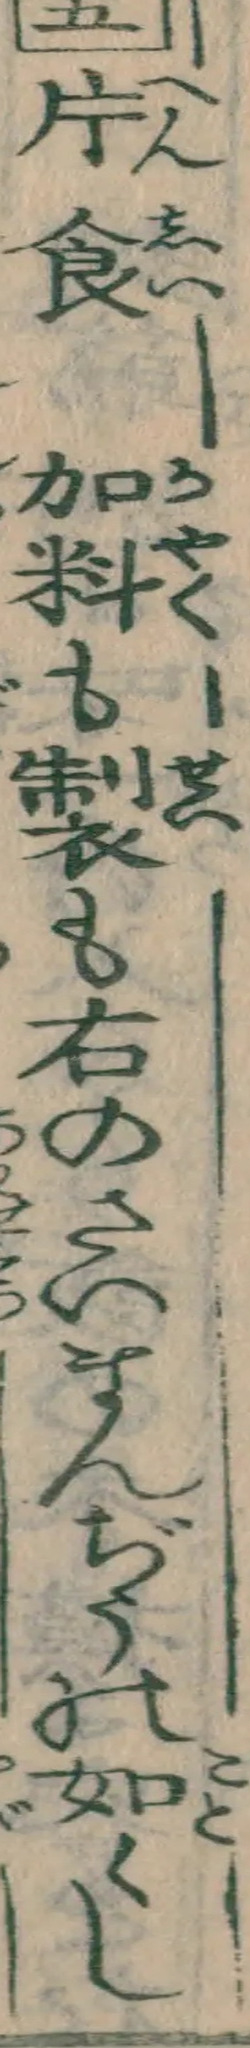十五片食加料も製も右のさいまんぢうの如くし
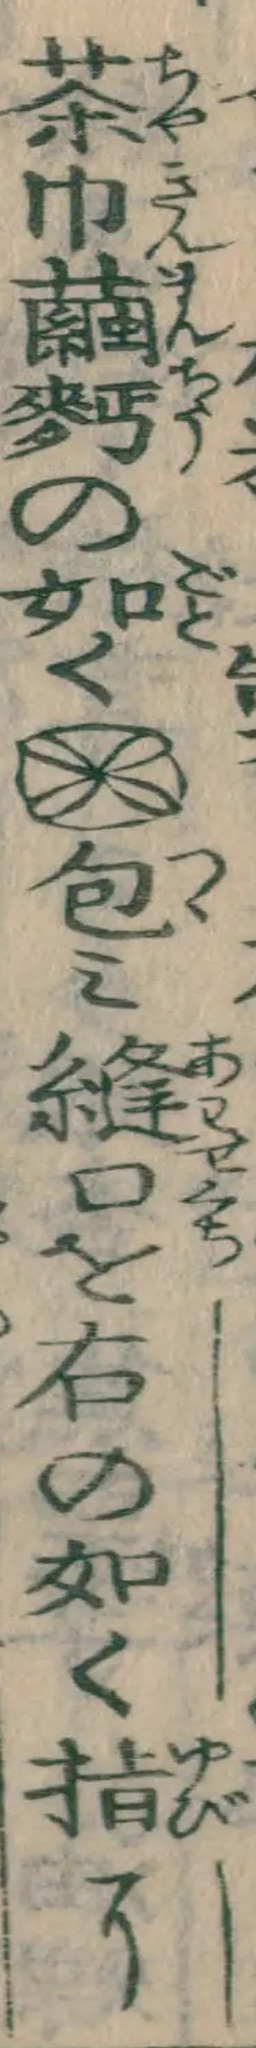茶巾繭麺の如く包み縫口を右の如く指に
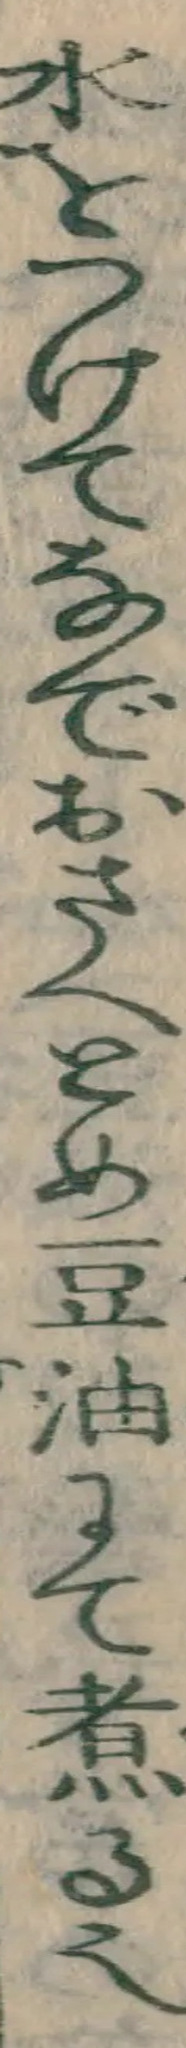水をつけてなでおさへとめ豆油にて煮る也
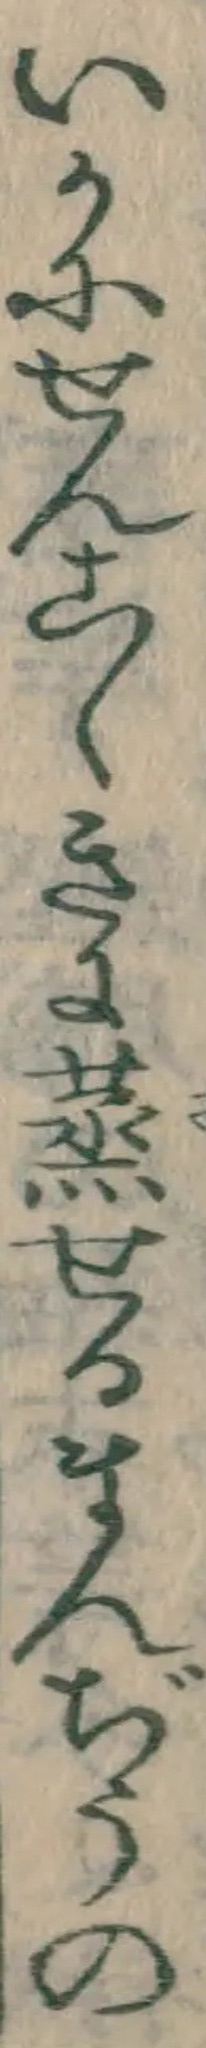いかにせんこくきに蒸せるまんぢうの
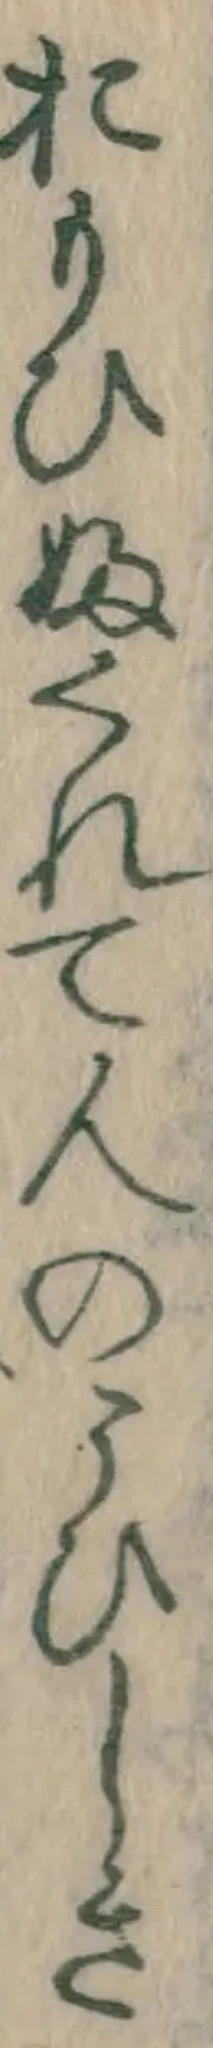おもひふくれて人のこひしき
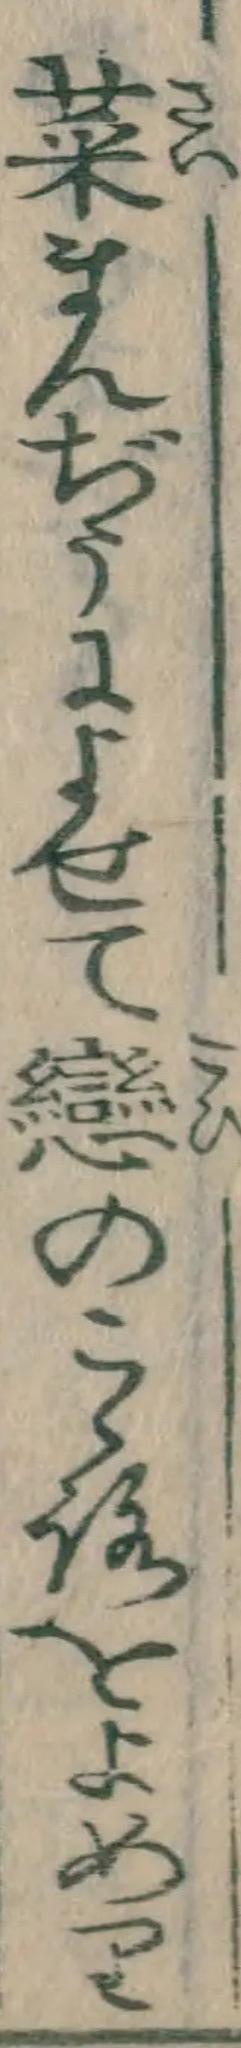菜まんぢうによせて恋のこゝろをよめり
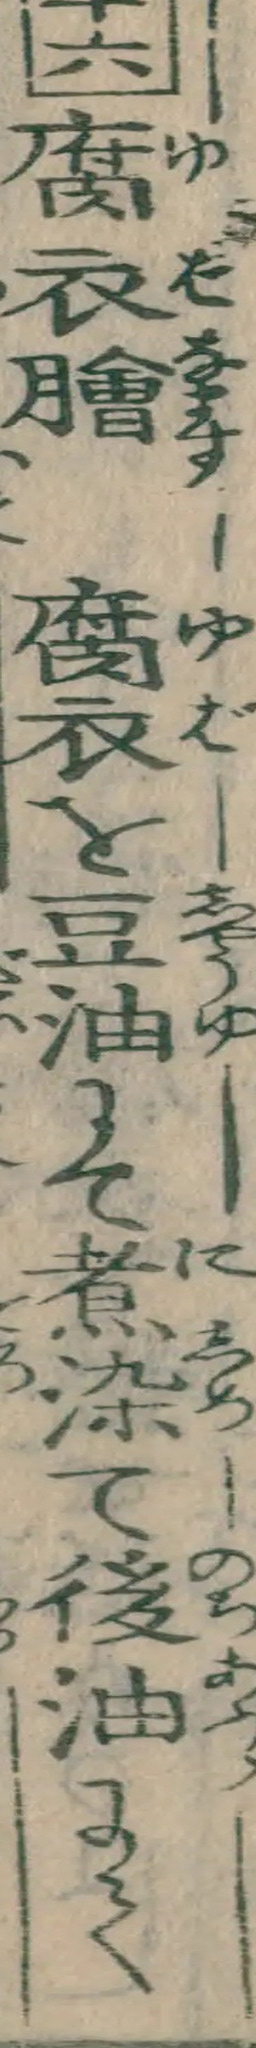十六腐衣膾腐衣を豆油にて煮染て後油にて
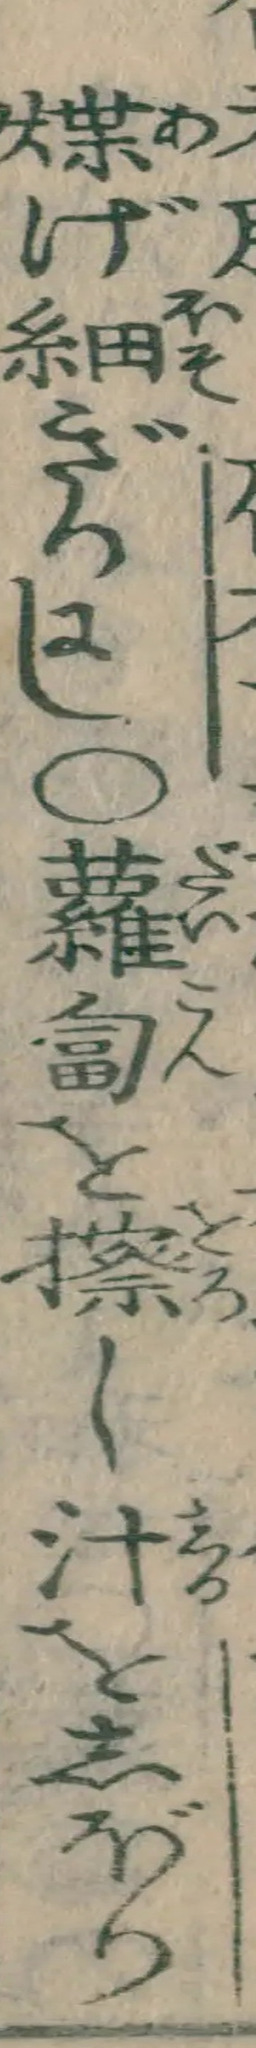煠げ細ぎりにし○蘿蔔を擦し汁をしぼり

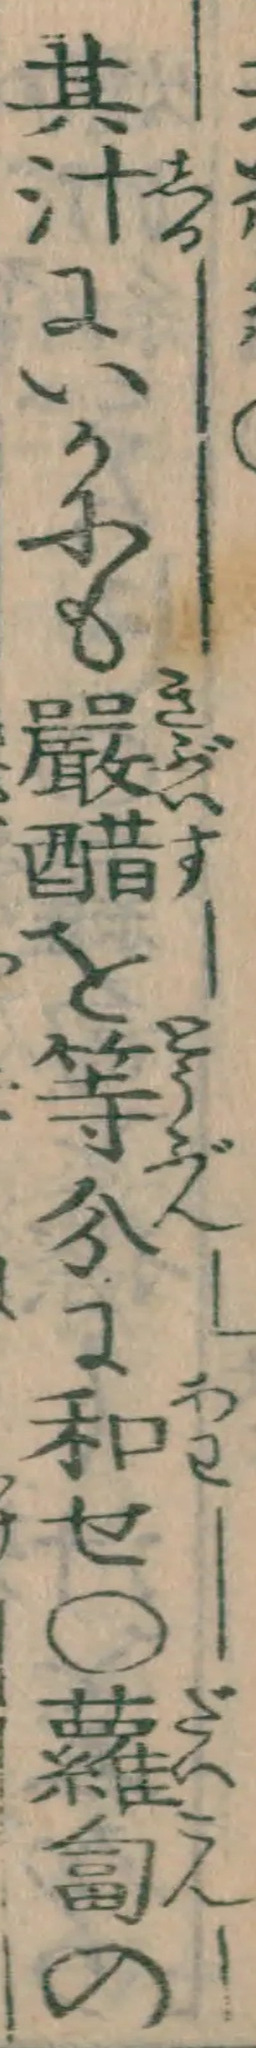其汁にいかにも厳醋を等分に和せ○蘿蔔の
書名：豆腐百珍. 続編
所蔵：国立国会図書館 National Diet Library, JAPAN
